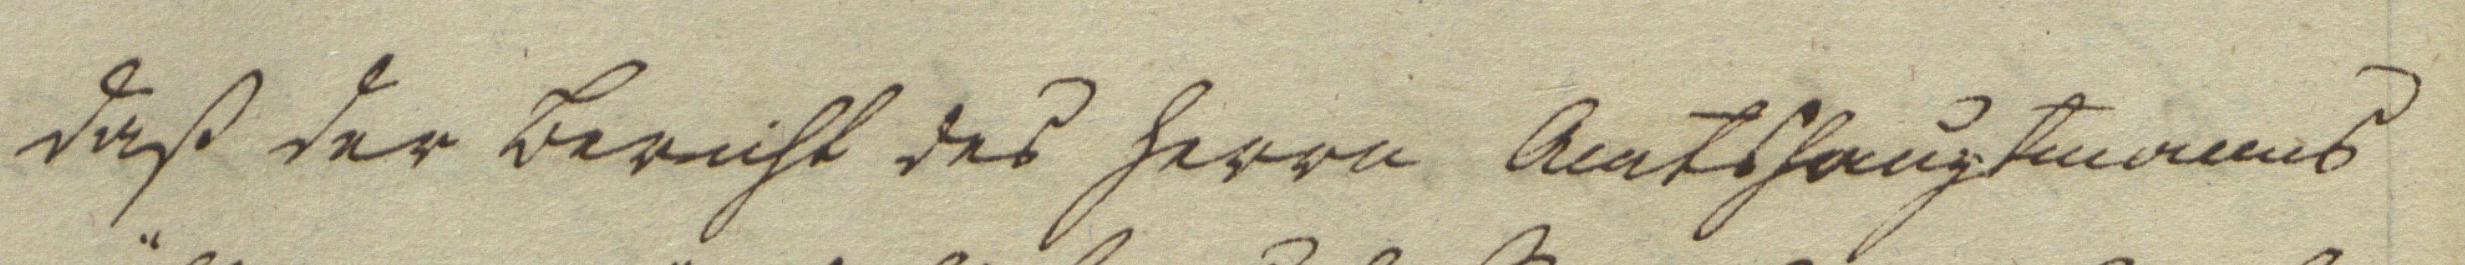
daß der Bericht des Herrn Amtshauptmanns
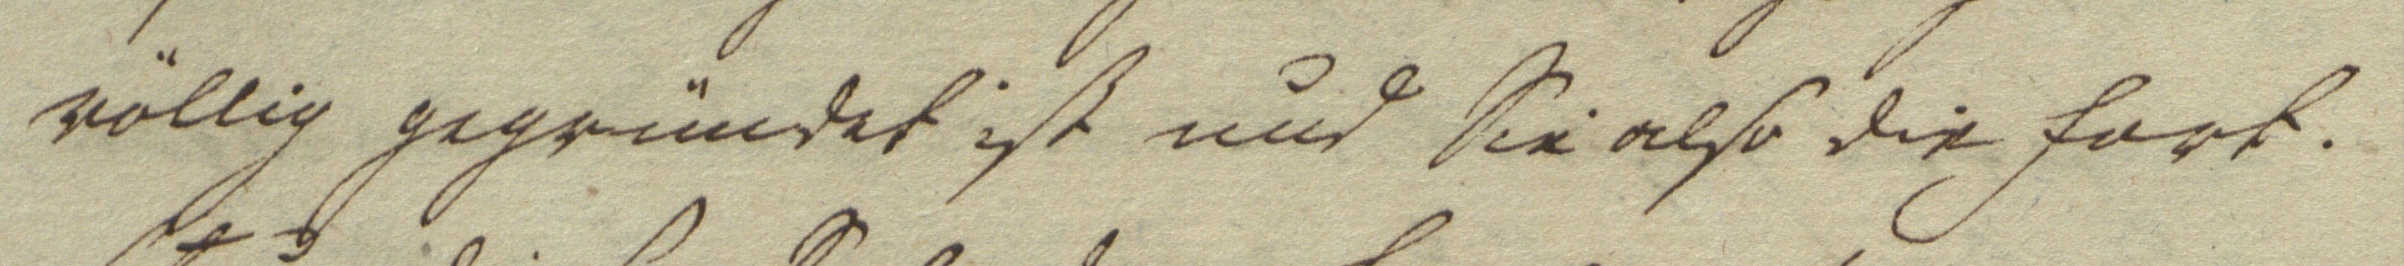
völlig gegründet ist und Sie also die Fort¬
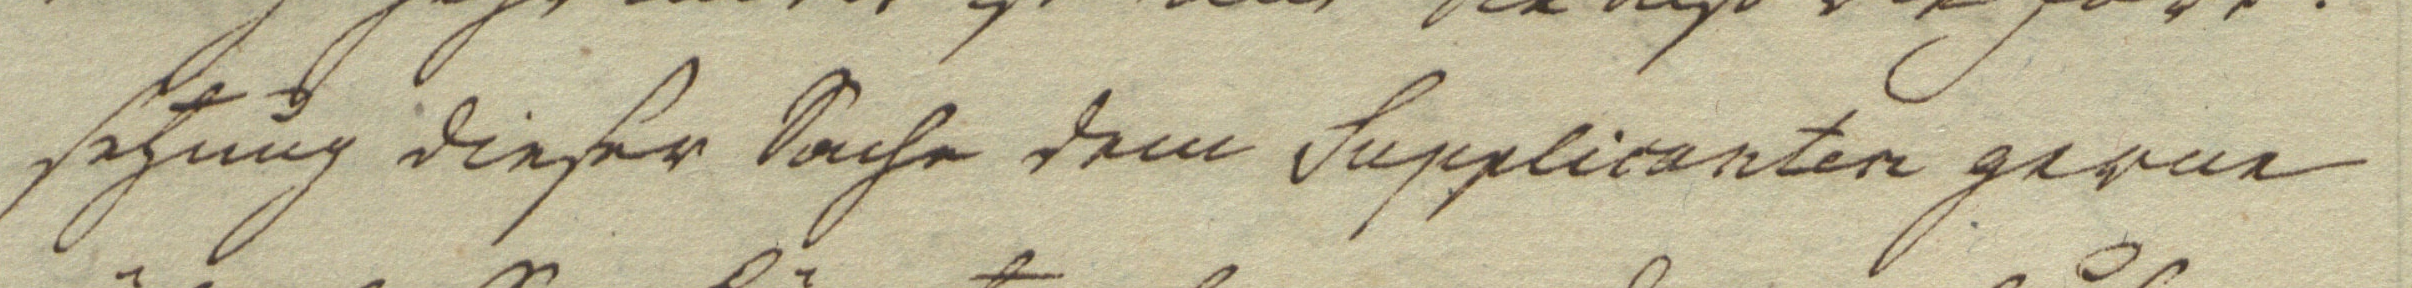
setzung dieser Sache dem Supplicanten gerne
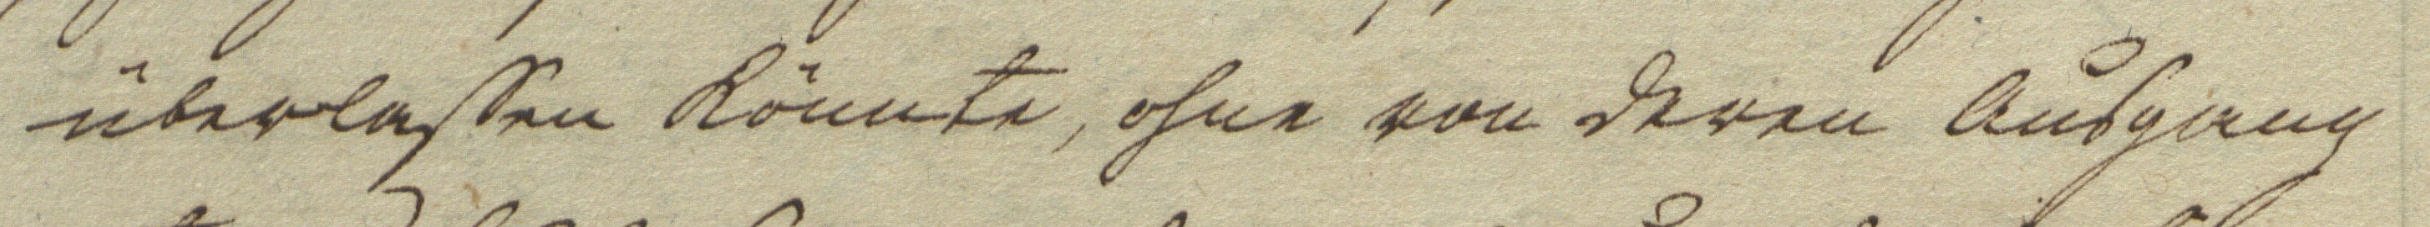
überlassen könnte, ohne von deren Ausgang
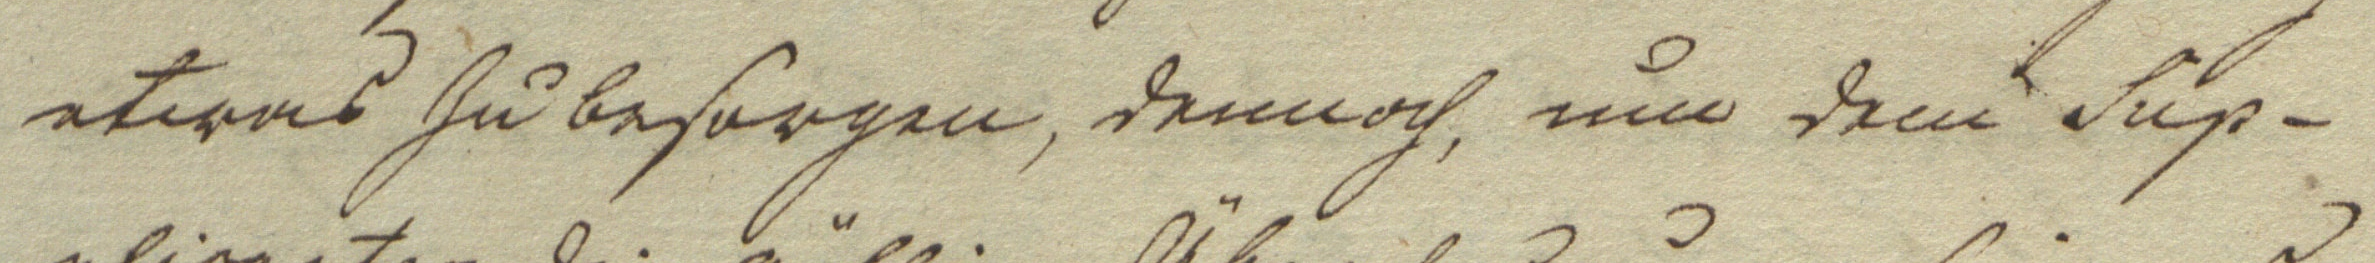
etwas zu besorgen, dennoch, um dem Sup¬
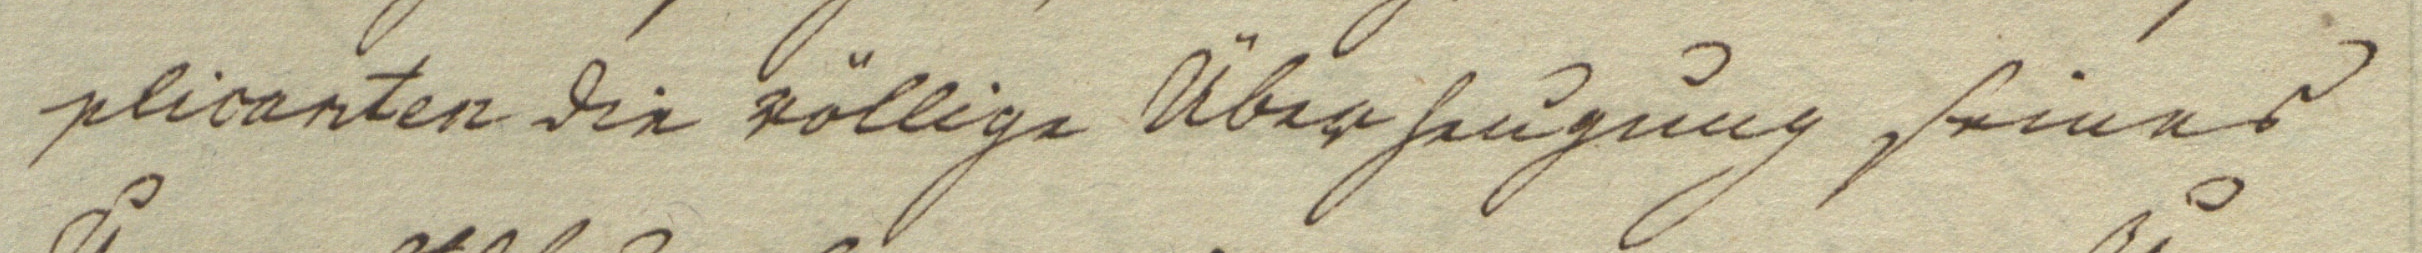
plicanten die völlige Überzeugung seines
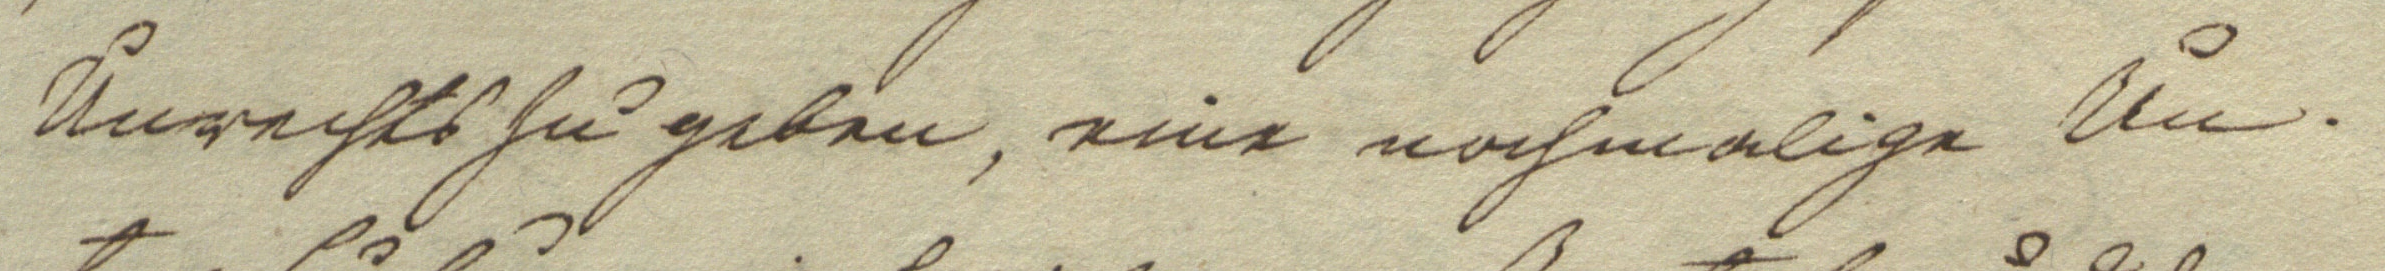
Unrechts zu geben, eine nochmalige Un¬
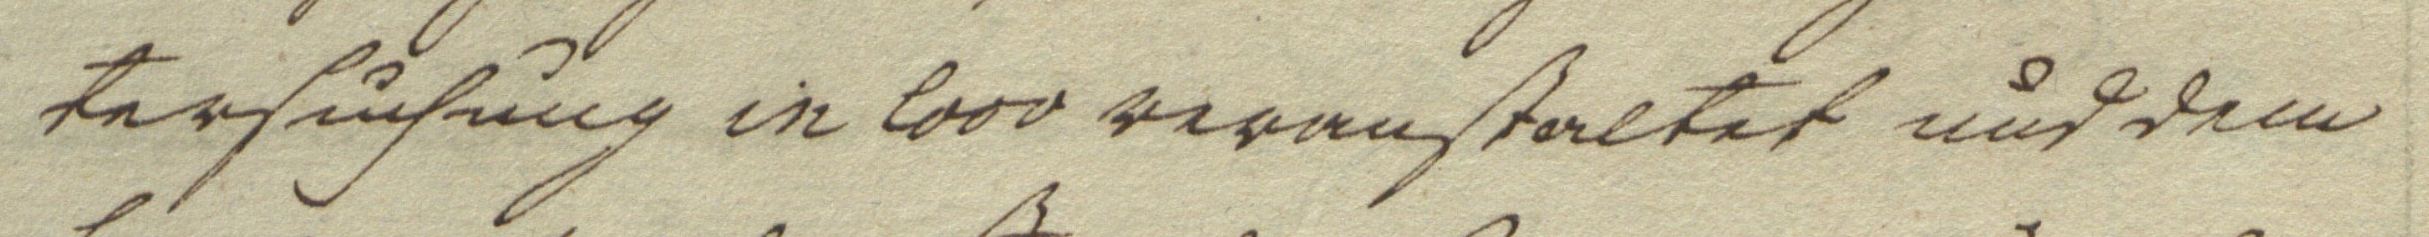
tersuchung in loco veranstaltet und dem
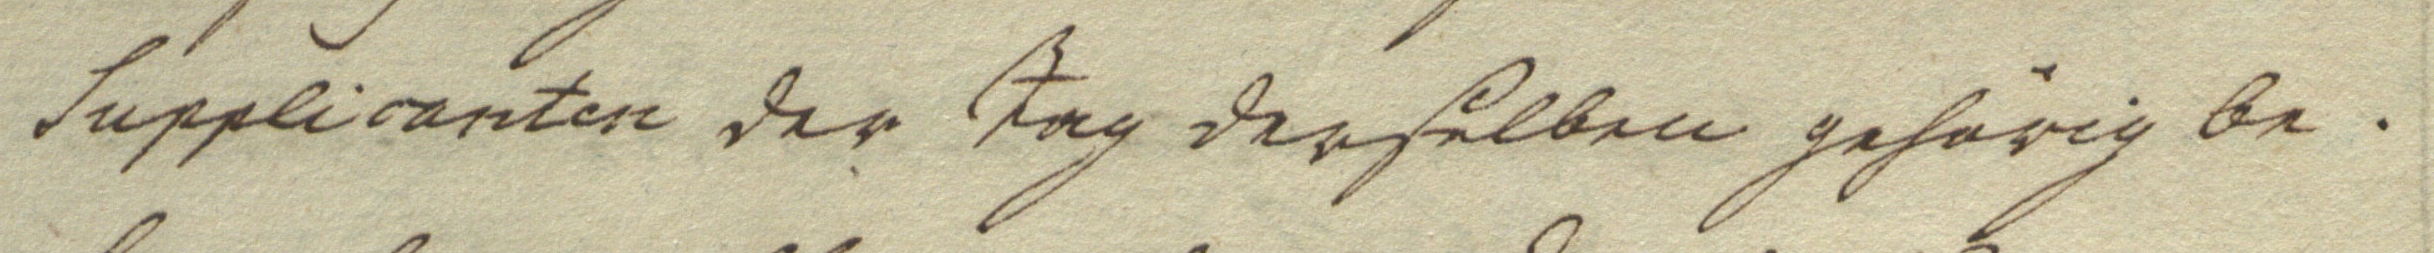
Supplicanten der Tag derselben gehörig be¬
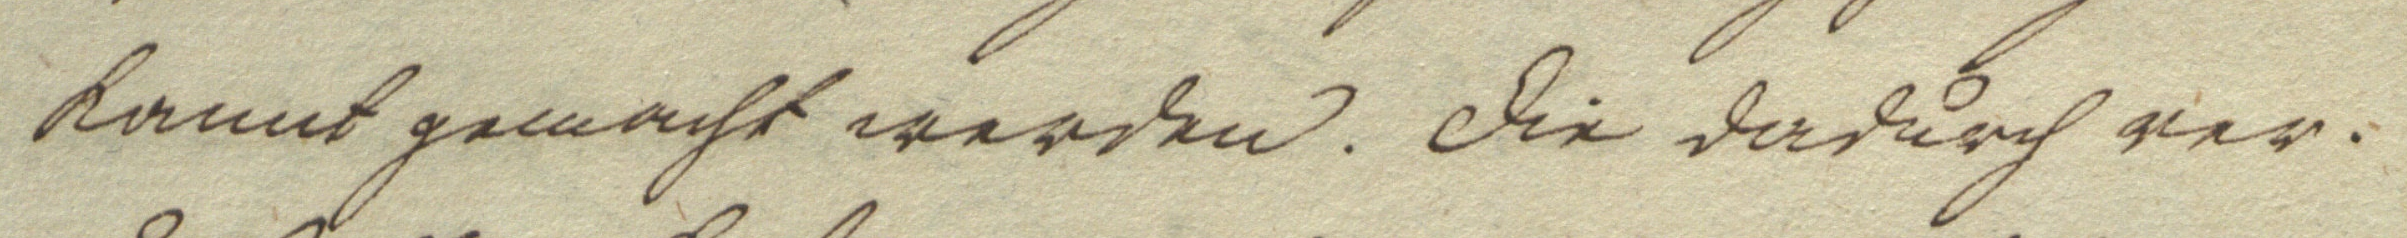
kannt gemacht werden. Die dadurch ver¬
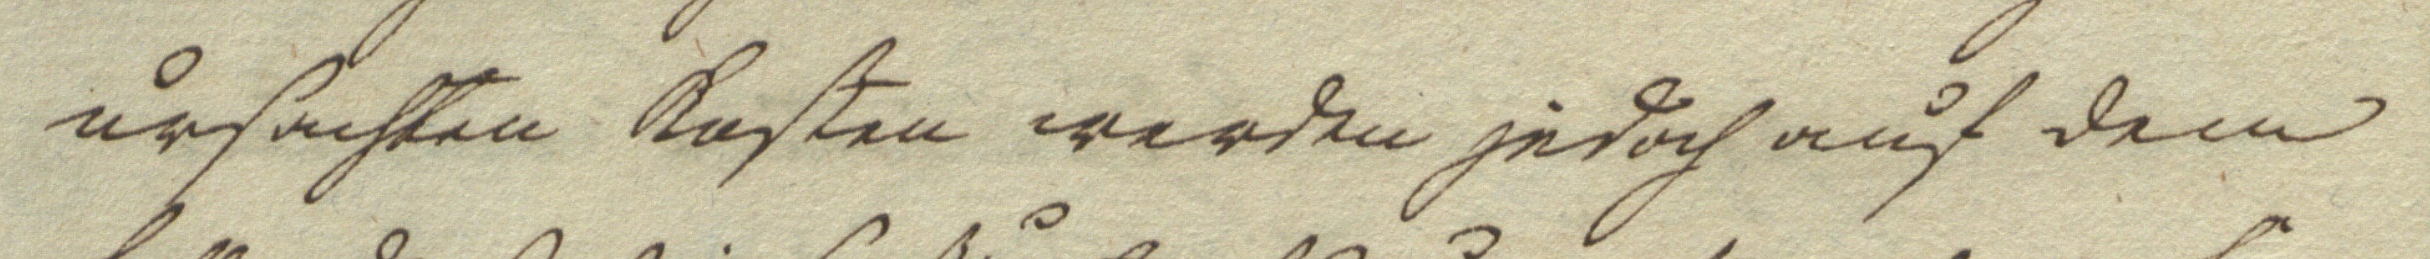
ursachten Kosten werden jedoch auf dem
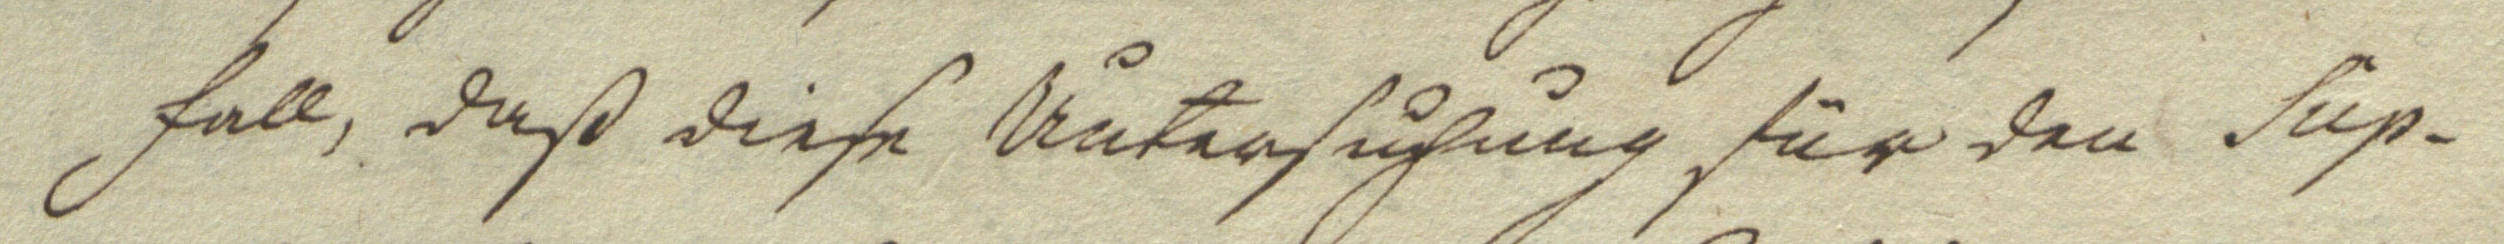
Fall, daß diese Untersuchung für den Sup¬
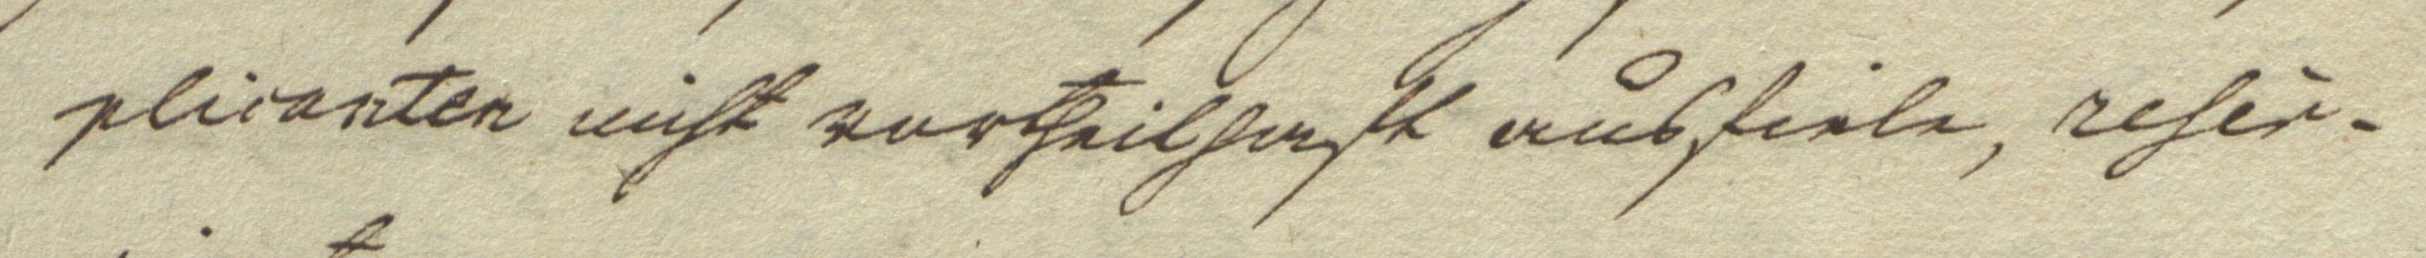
plicanten nicht vortheilhaft ausfiele, reser-
